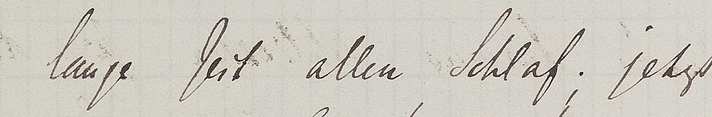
lange Zeit allen Schlaf; jetzt
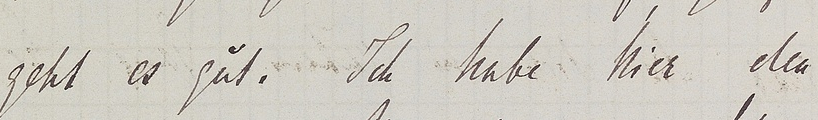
geht es gut. Ich habe hier den
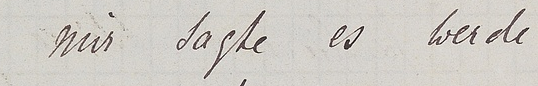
mir sagte es werde
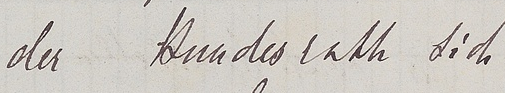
der Bundesrath sich
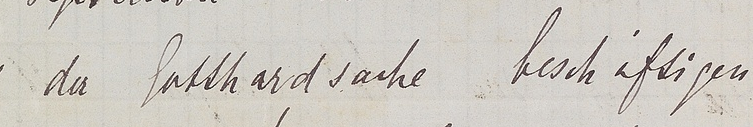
der Gotthardsache beschäftigen
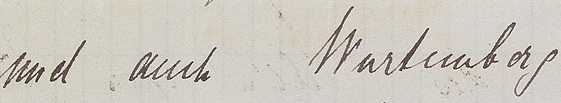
und auch Würtemberg
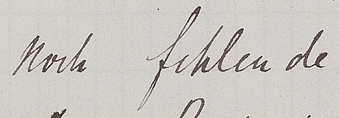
noch fehlende
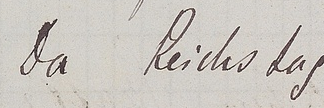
Der Reichstag
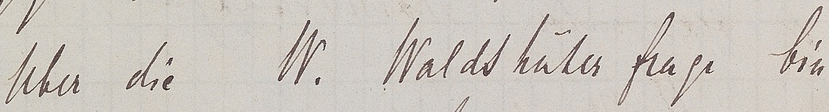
Über die W.Waldshuterfrage bin
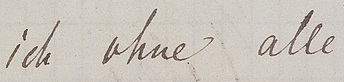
ich ohne alle
